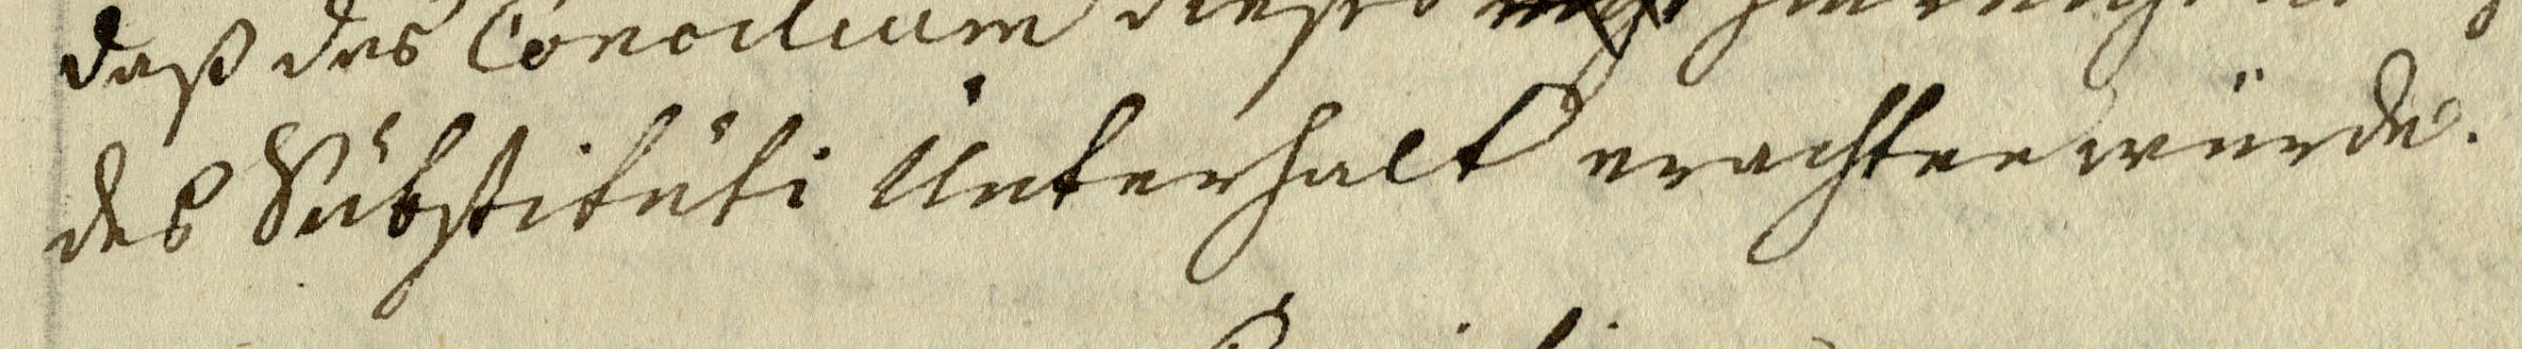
des Substituti Unterhalt erachten würde.
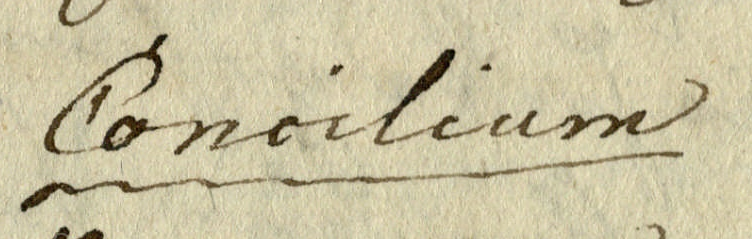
Concilium
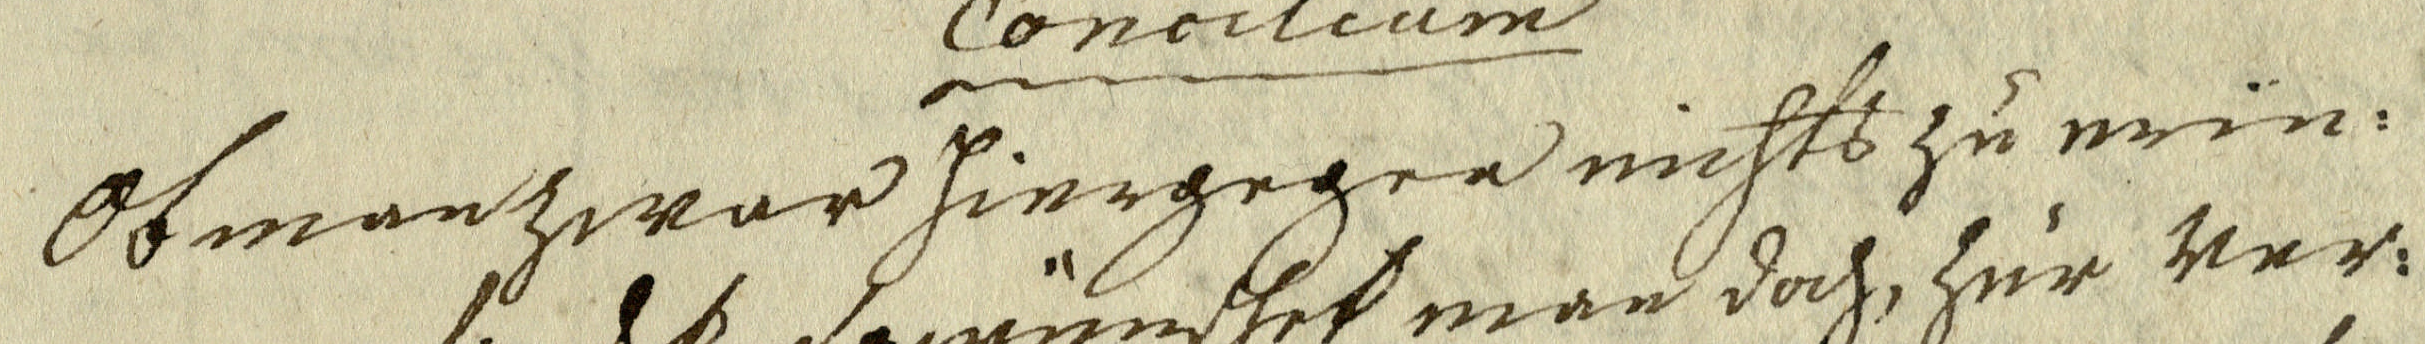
Ob man zwar hiergegen nichts zu erin¬
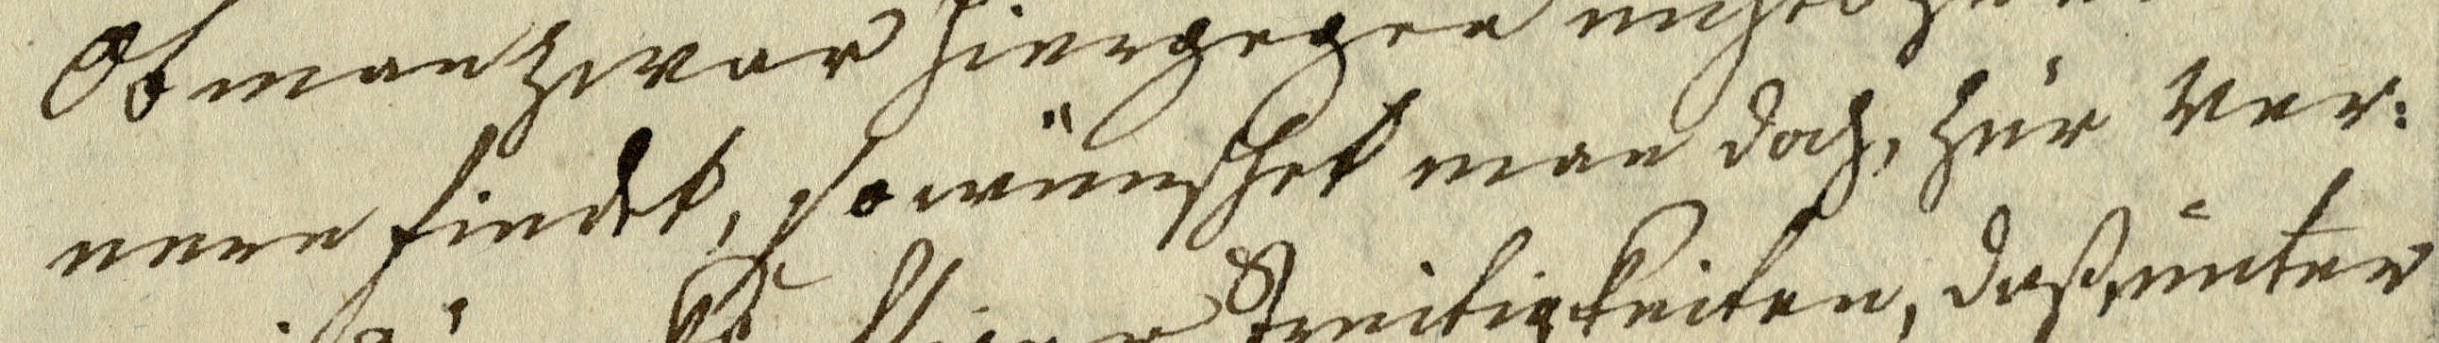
nern findet, so wünschet man doch, zur Ver¬
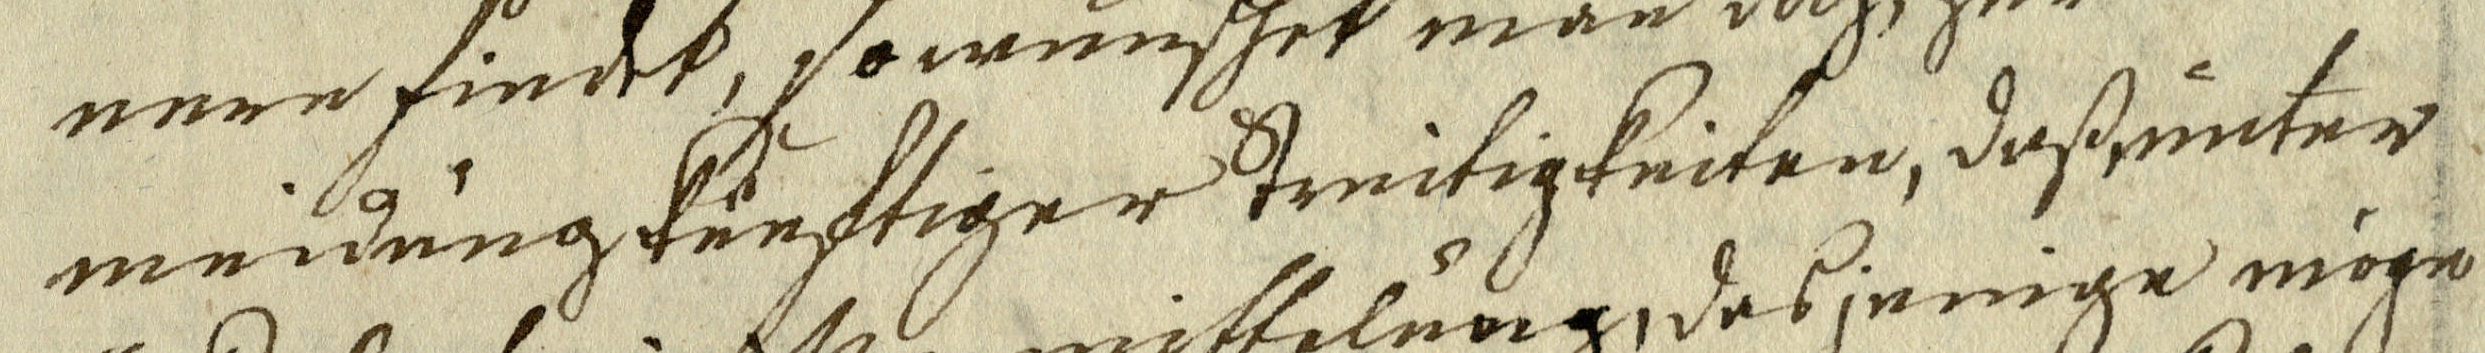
meidung künftiger Streitigkeiten, daß unter
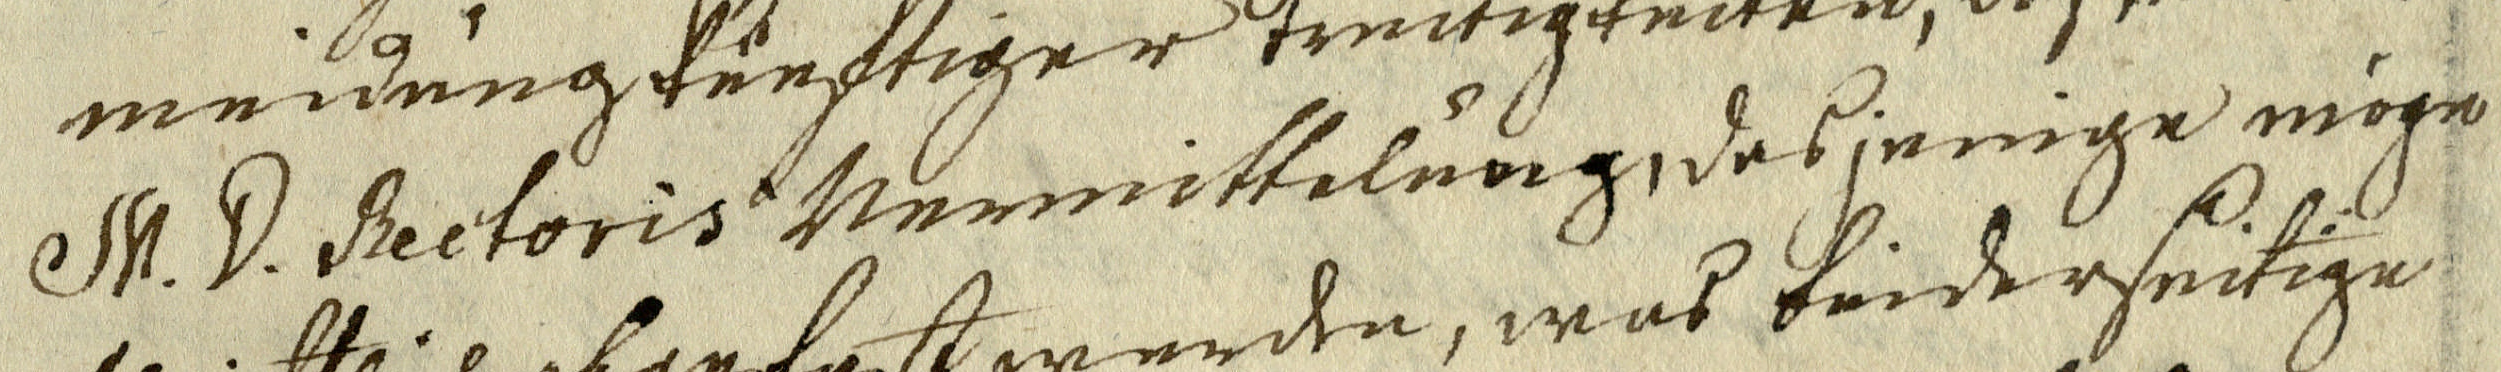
M. D. Rectoris Vermittelung, das jenige möge
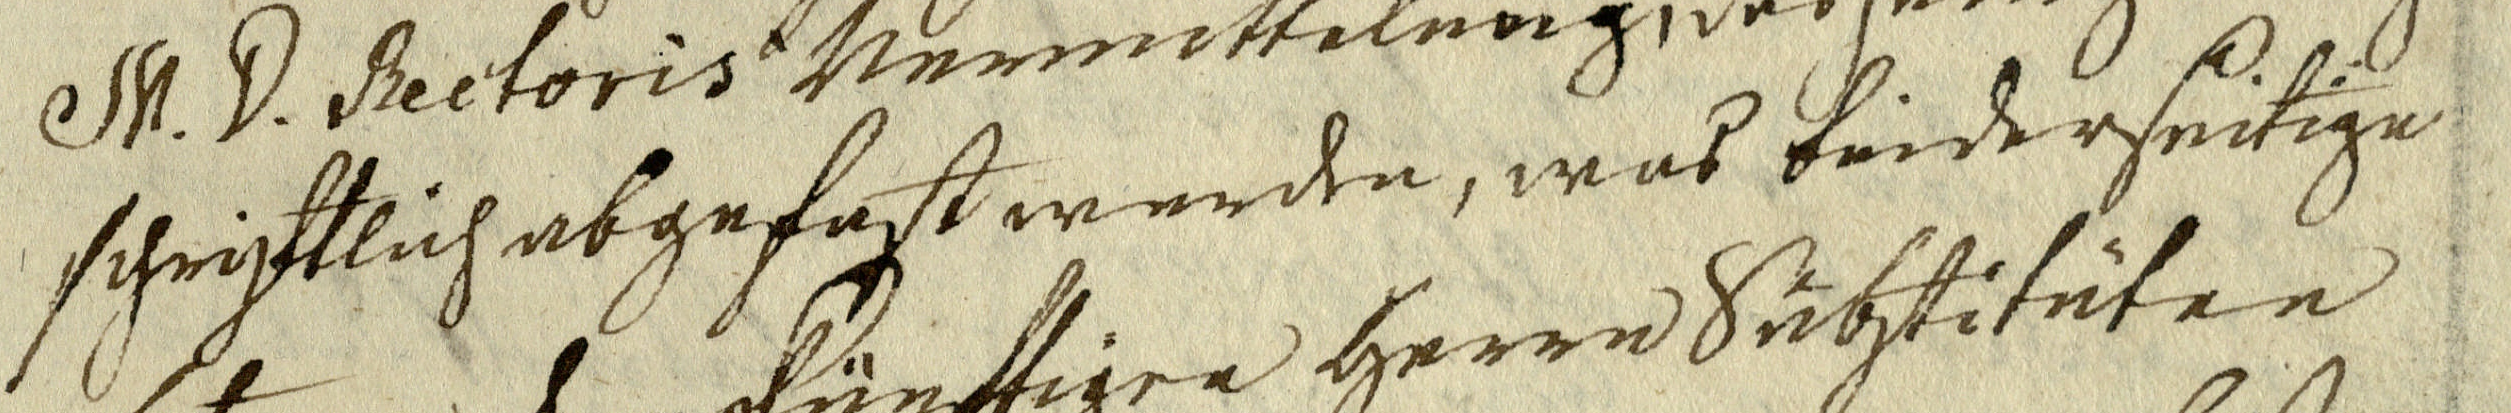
schriftlich abgefast werden, was beiderseitige
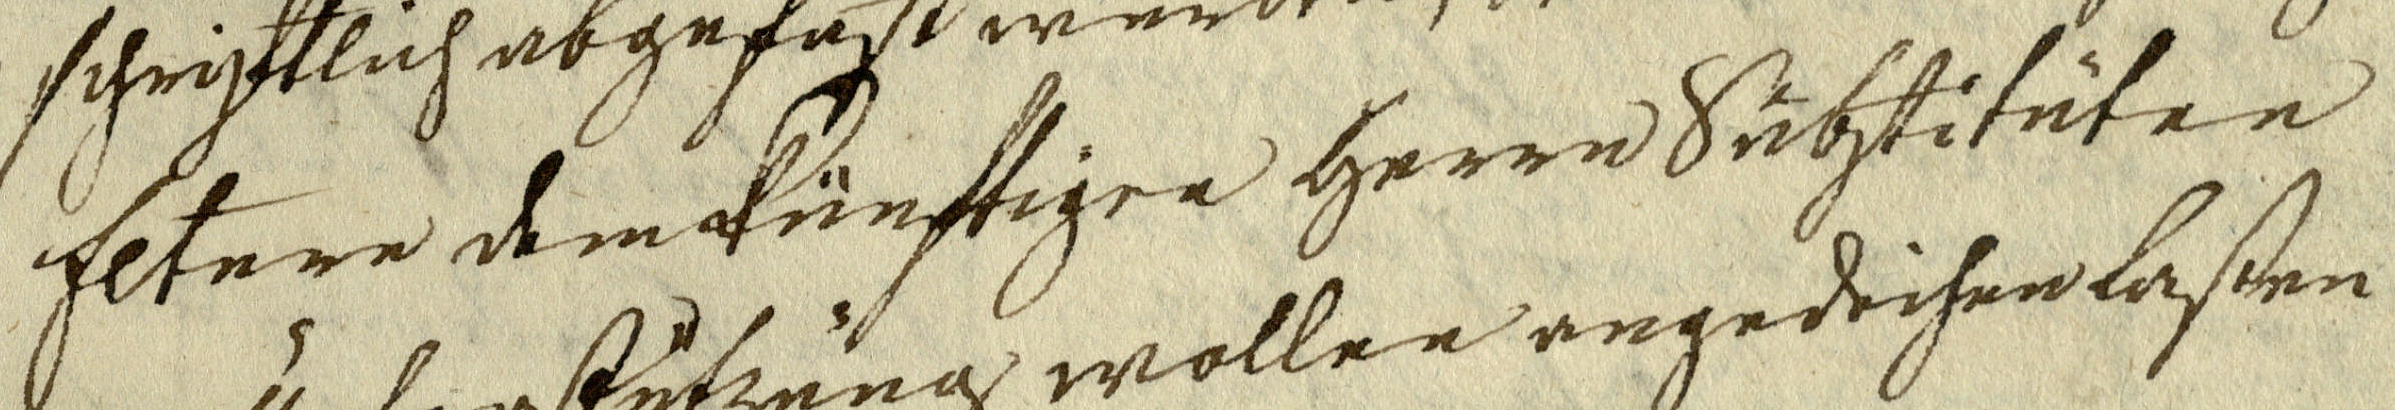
Eltern dem künftigen Herrn Substituten
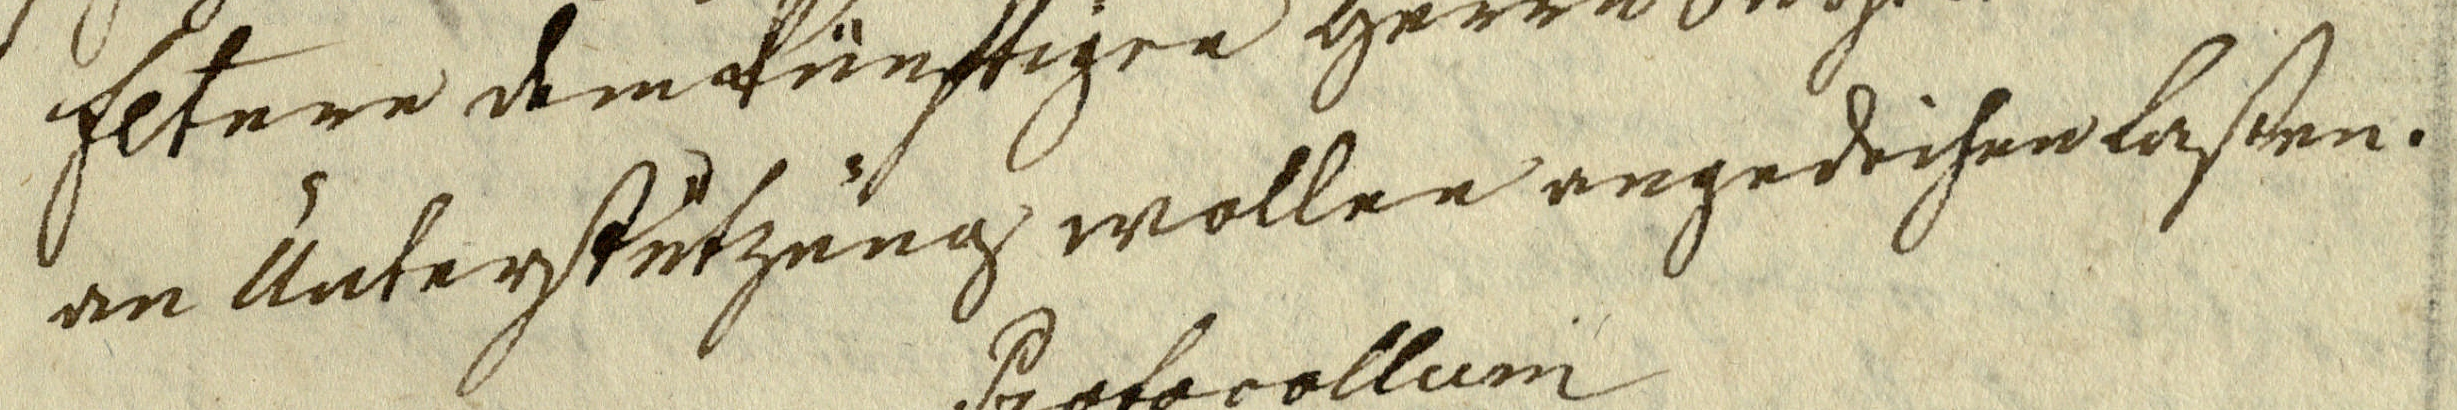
an Unterstützung wollen angedeihen laßen.
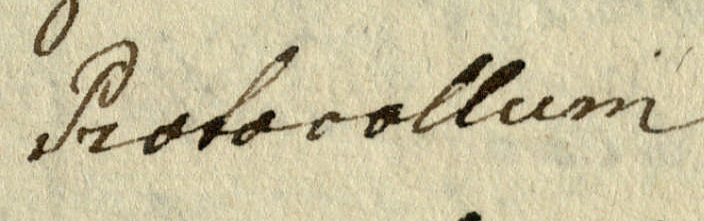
Protocollum
